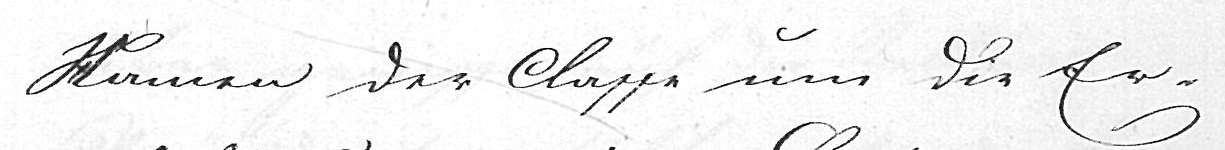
Namen der Classe um die Er-
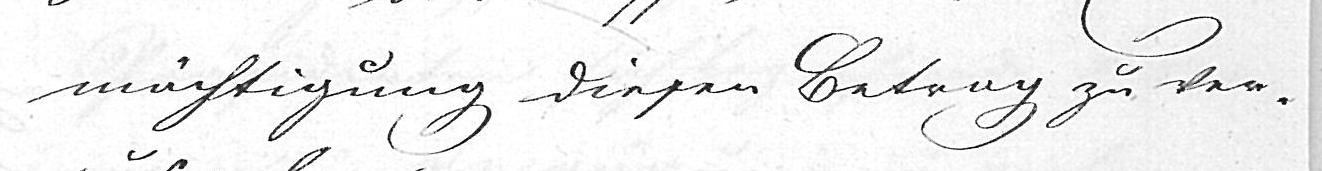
mächtigung diesen Betrag zu ver-
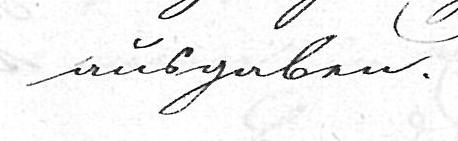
ausgaben.
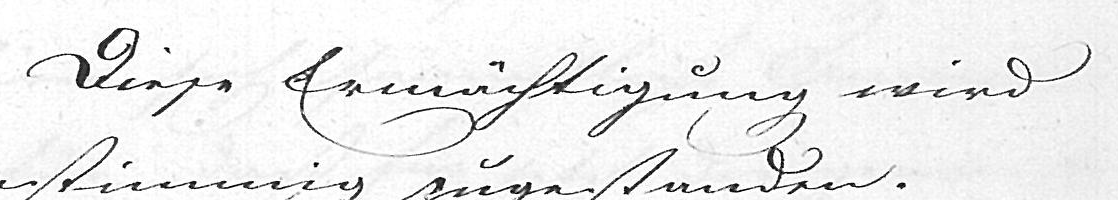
Diese Ermächtigung wird
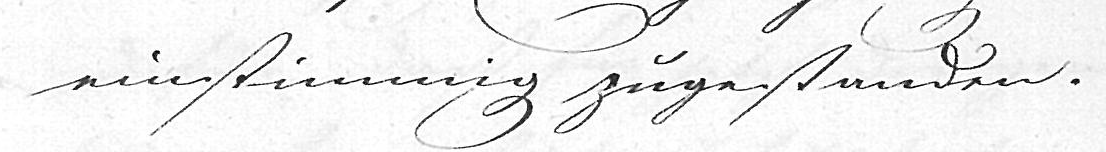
einstimmig zugestanden.
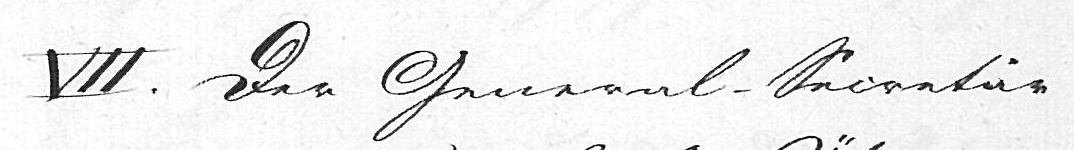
VII. Der General-Secretär
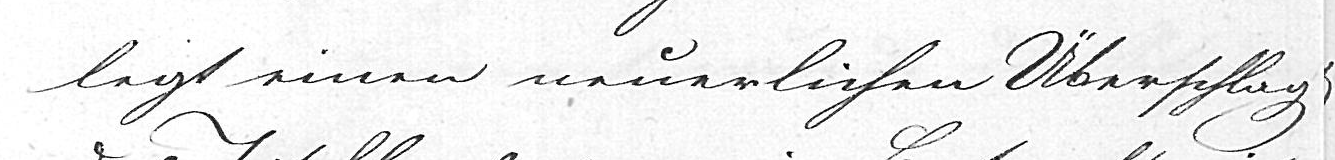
legt einen neuerlichen Überschlag
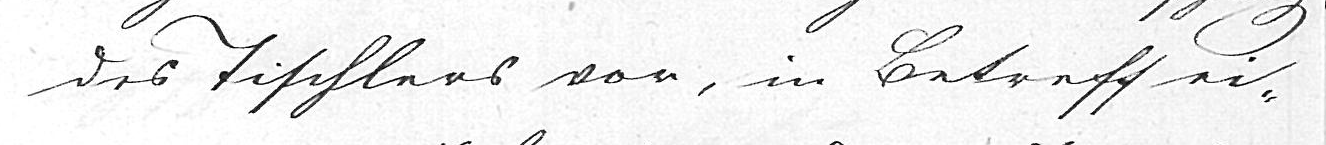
des Tischlers vor, in Betreff ei-
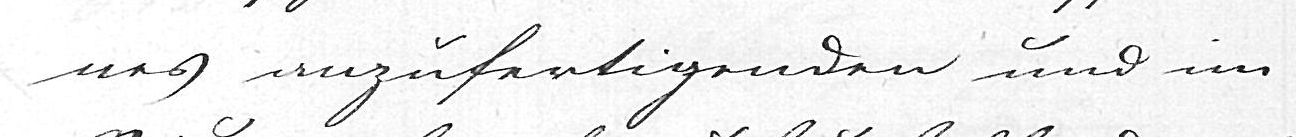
nes anzufertigenden und im
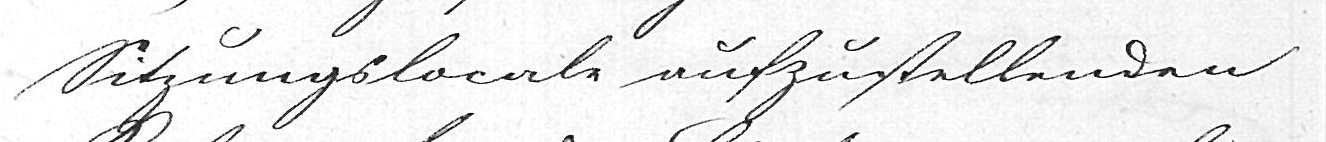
Sitzungslocale aufzustellenden
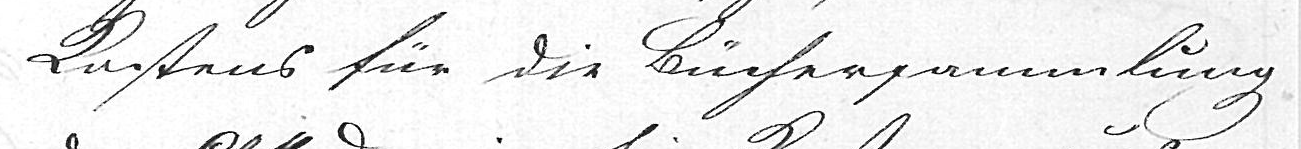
Kastens für die Büchersammlung
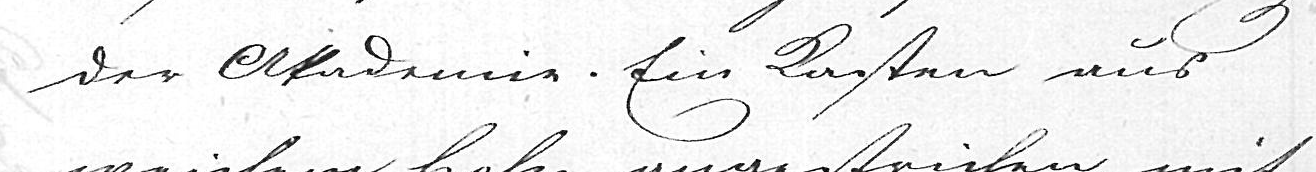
der Akademie. Ein Kasten aus
